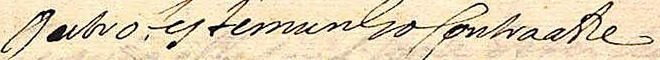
Outro testemunho Contra a Re
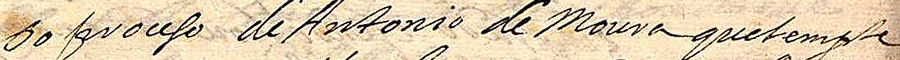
Do proceso de Antonio de Moura que tem pte
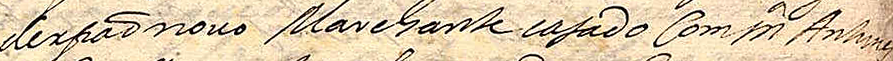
de xpão nouo Marchante casado Com ma Antunes
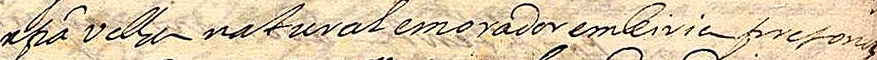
xpā velha natural e morador em leiria preso nos
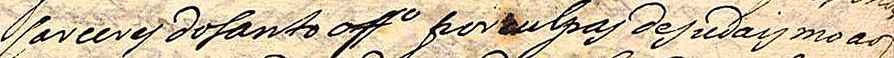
Carceres do santo offo por culpas de judaismo aos
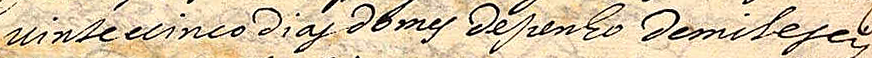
uinte e cinco dias do mes de Junho de mil e seis
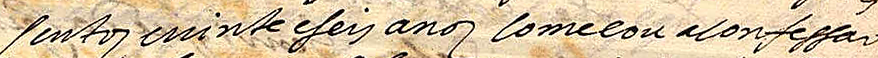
Centos e uinte e seis anos comecou a confessar
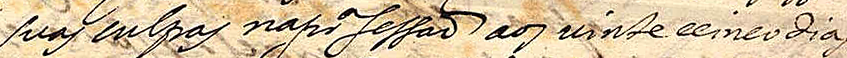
suas culpas na pra sessaõ aos uinte e cinco dias
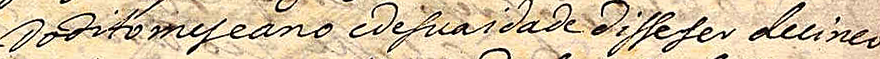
do dito mes e ano e de sua idade disse ser de cinco
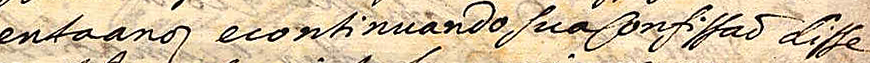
enta anos e continuando sua Confissaõ disse
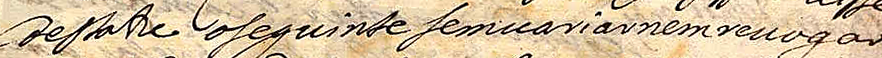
desta Re o seguinte sem uariar nem reuogar
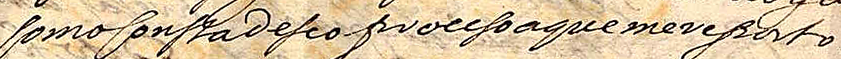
Como Consta de seu proceso a que me reporto
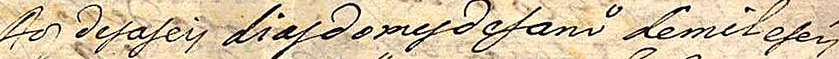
Aos desaseis dias do mes de Janro de mil e seis
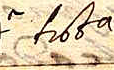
4a testa
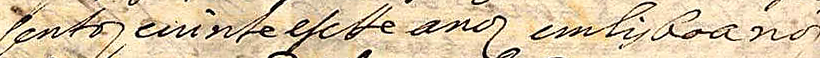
Centos e uinte e sette anos em lisboa nos
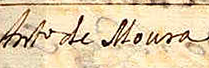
Anto de Moura
